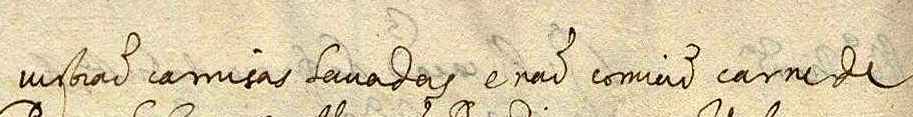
uistiaõ camisas Lauadas, e naõ comiaõ carne de
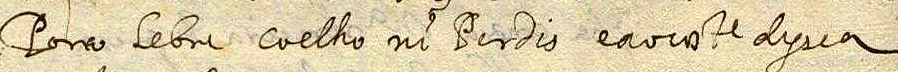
Porco Lebre coelho nē Perdis e ao cos.te disse a
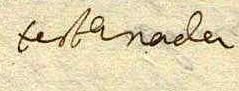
test.a nada
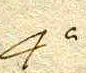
4a
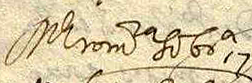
Ma romra sobra
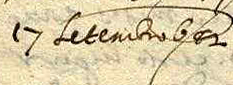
17 Setembro 642
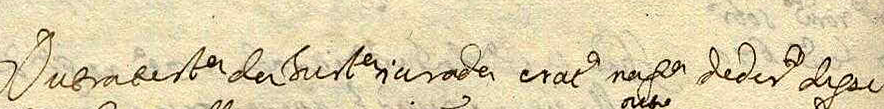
Ma romra sobra q̄ Outra testa da Iusta iurada era ta na fra de derto disse
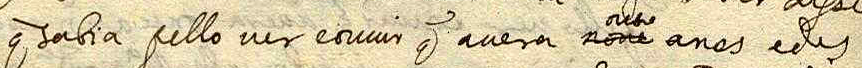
q̄ sabia pello uer e ouuir q̄ auera outo anos e des
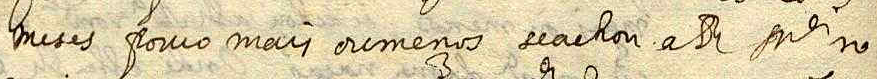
meses pouco mais ou menos se achou a R Ma ro
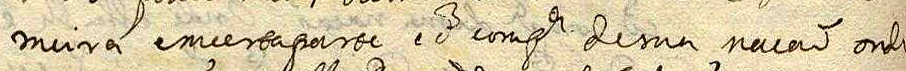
meira em certa parte, e cō compa de sua naçaõ onde
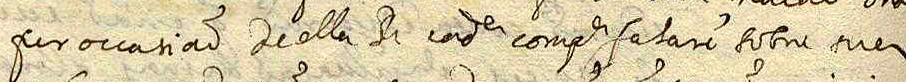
per occasiaõ de ella Re e a da compa falarē sobre sua
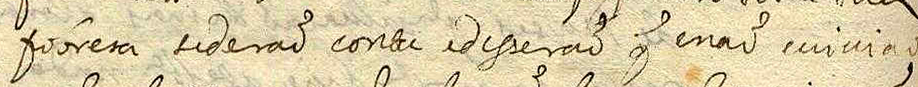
pobresa se deraõ conta e disseram q̄ creaõ e uiuiaõ
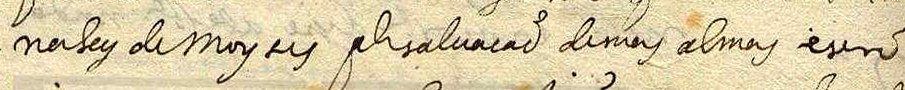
na ley de Moyses pa saluaçaõ de mais almas e serē
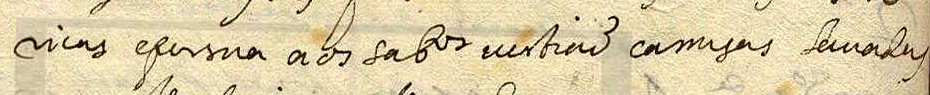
ricas e por sua aos sabos uestiaõ camisas lauadas
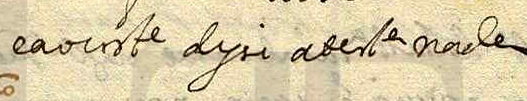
e ao coste disse a testa nade
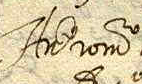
Anto romro
